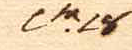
cta 18
